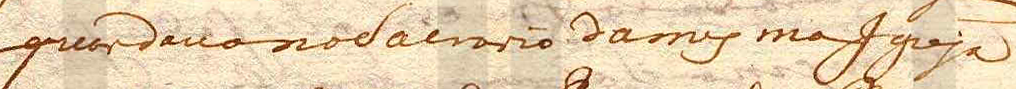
guardaua no Sacrario da mesma Jgreja
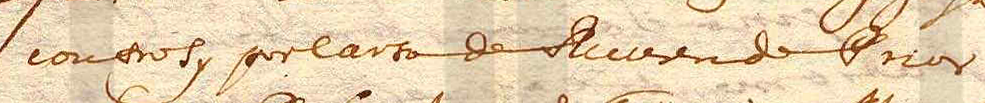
e outrosy por carta de Reuerendo Prior
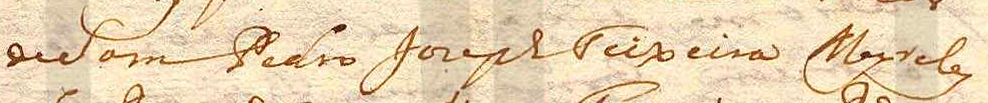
de Sam Pedro Jozeph Teixeira Meyreles
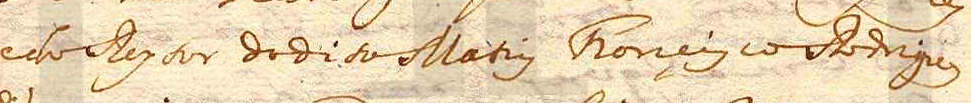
e do Reytor da dita Matriz Francisco Rodrigues
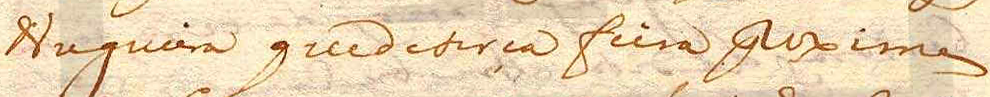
Nugueira que de terça feira proxime
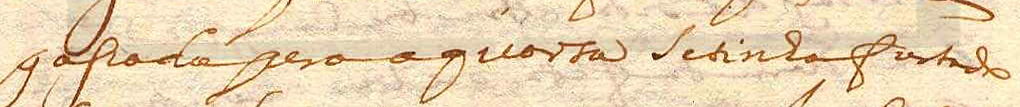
passada pera a quarta se tinha furtado
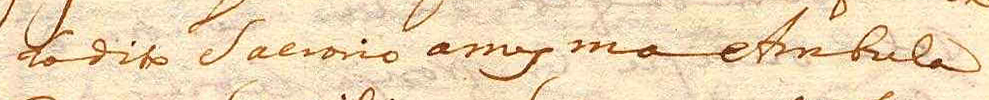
do dito Sacrario a mesma Ambula
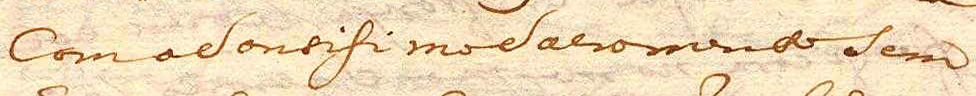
Com o Santisimo Sacramento sem
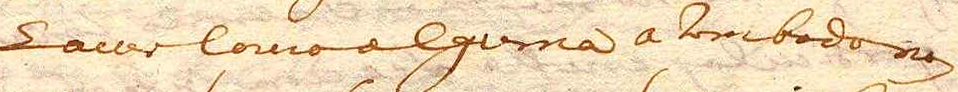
hauer couza alguma aRombada nas
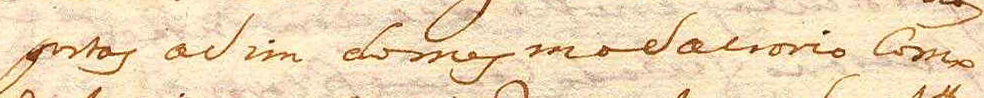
portas, asim do mesmo Sacrario como
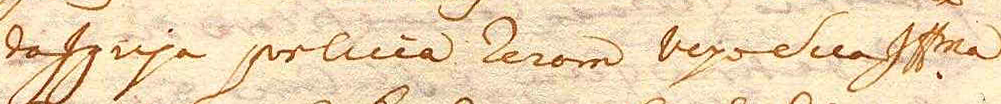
da Jgreja por cuia Rezam veyo sua Jll.ma
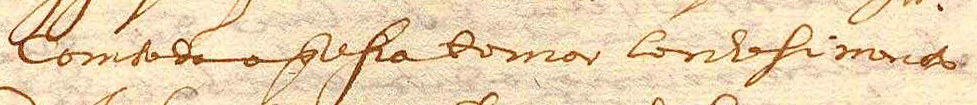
com toda a pressa tomar conhesimento
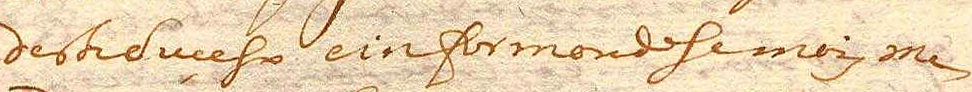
deste suceso e informandose mais me
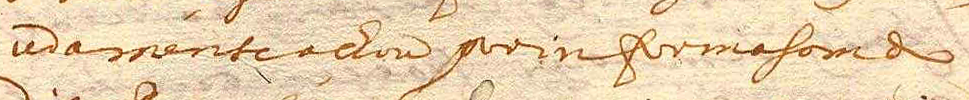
udamente achou por informasam do
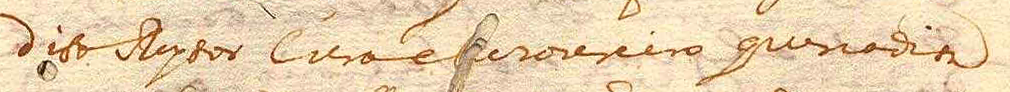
dito Reytor Cura e _ezoreiro que na dita
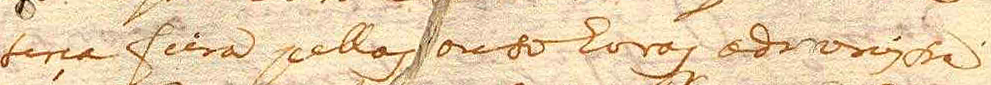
terça feira pellas outo horas administra
